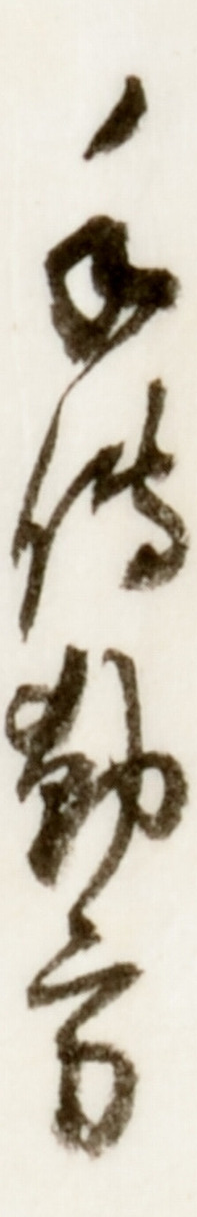手伝勤方
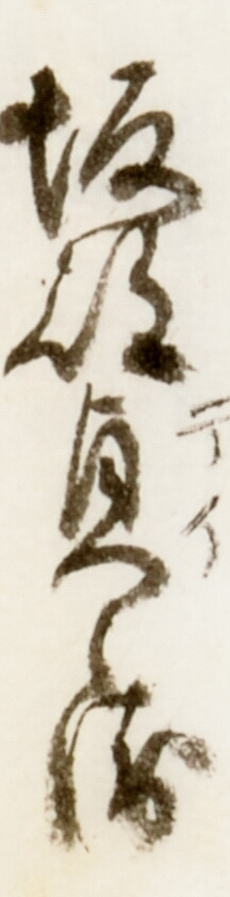坂部貞兵衛
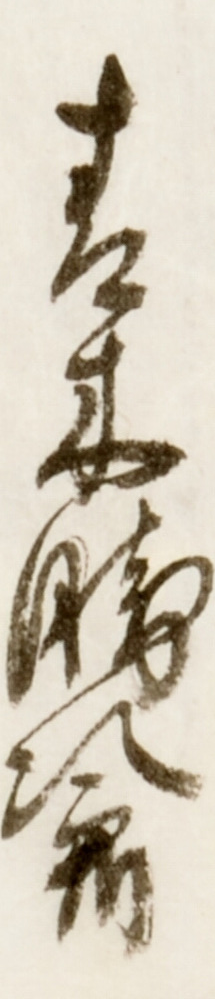青木勝次郎
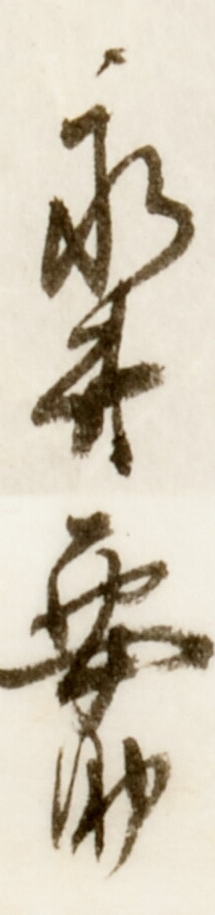永井要助
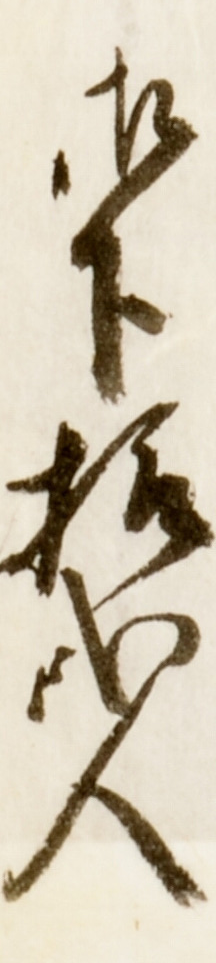御下拾弐人
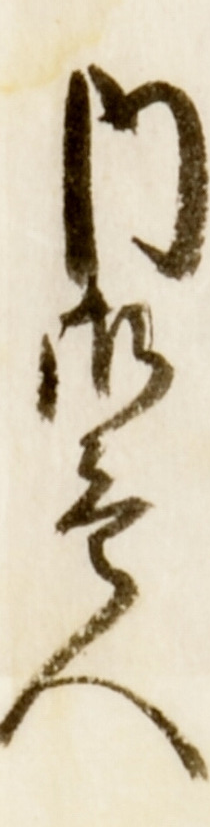内御壱人
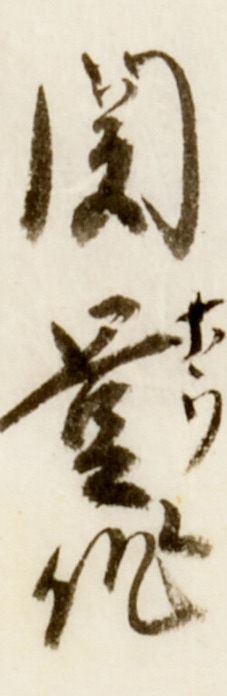関豊作
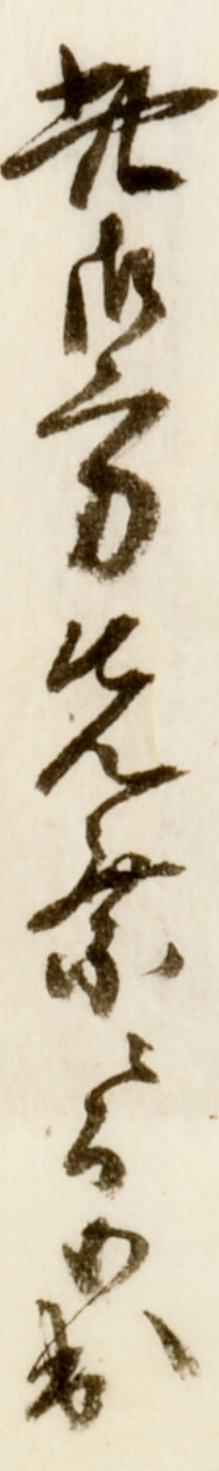此御方先乗ニ而御出
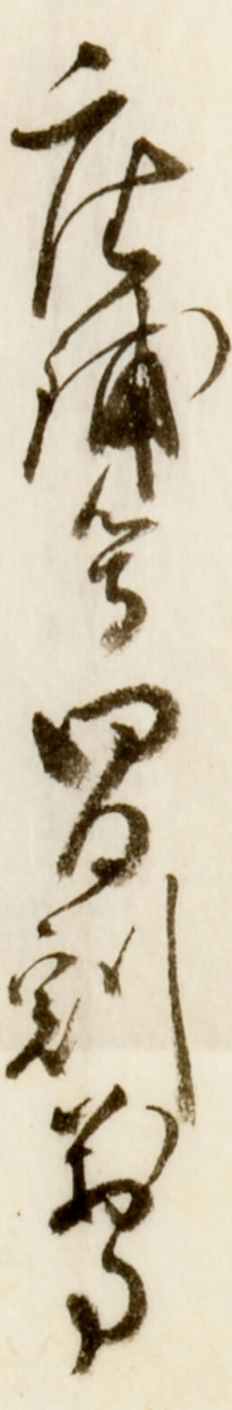座鋪等間割万事
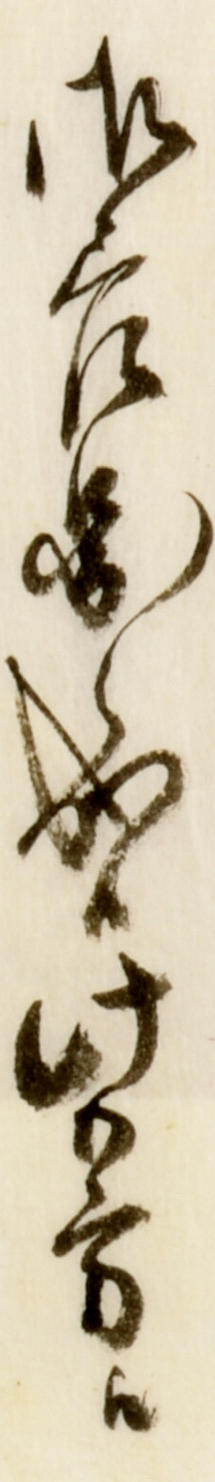御差図被成候此御方江
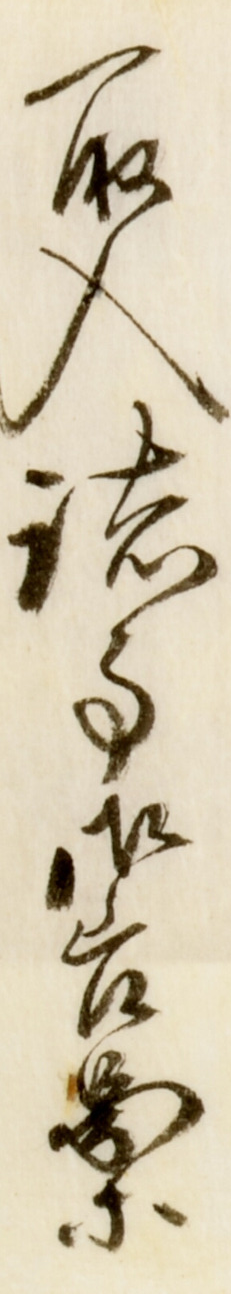取人諸事御差図等
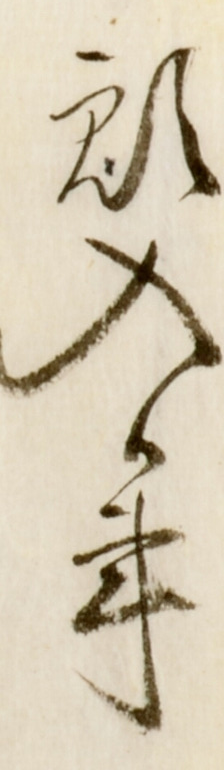願入候事

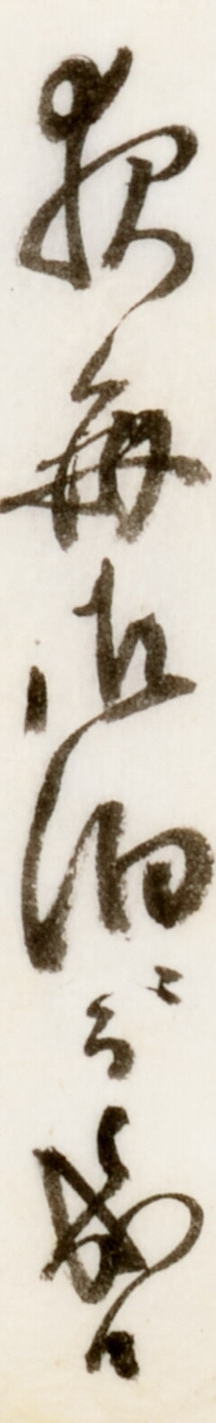夜毎御泊ニ而被成候
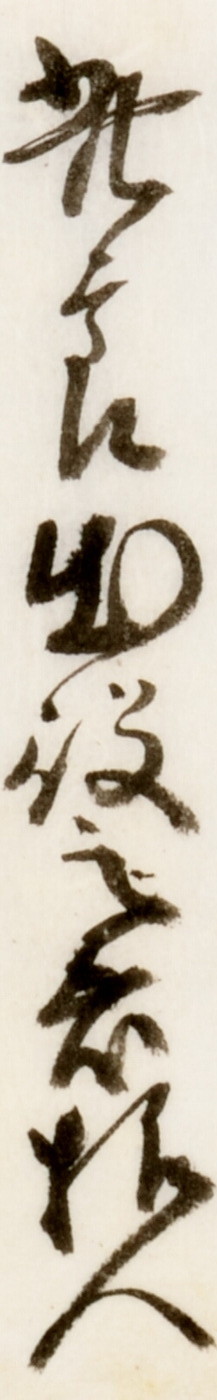此節出役之者拾人
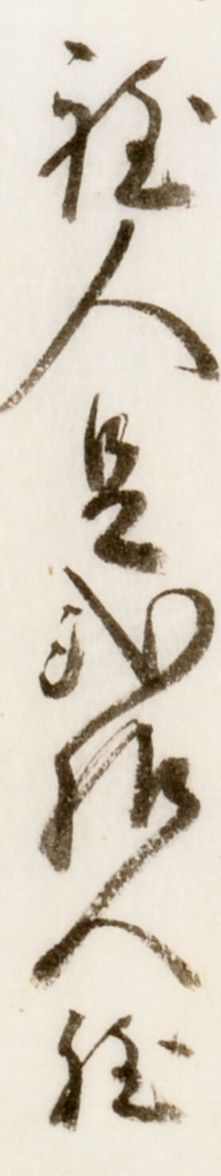程人足弐拾人程
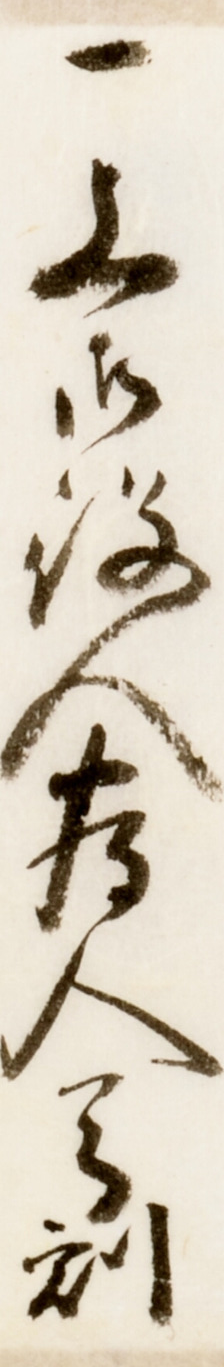一上御役人為人馬別
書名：覚
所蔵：伊那市立高遠町図書館・合同会社AMANE
